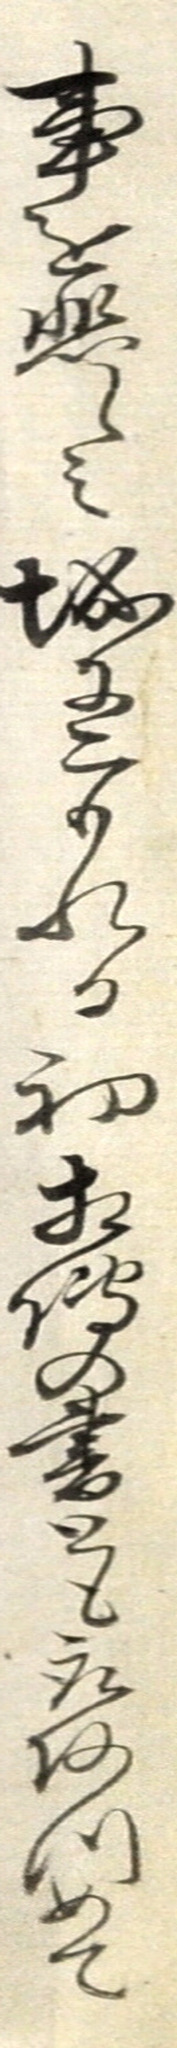事を悲しみ城にこもれる初相伝の書とも取あつめて
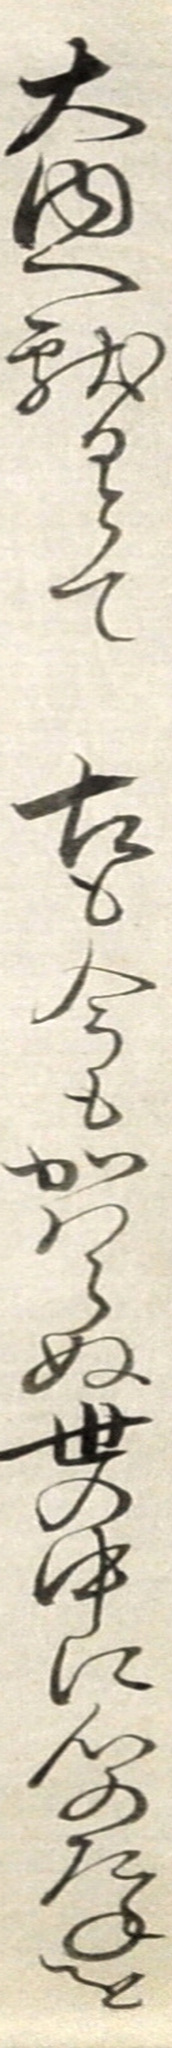大内へ献るとて古も今もかはらぬ世の中に心のたねを
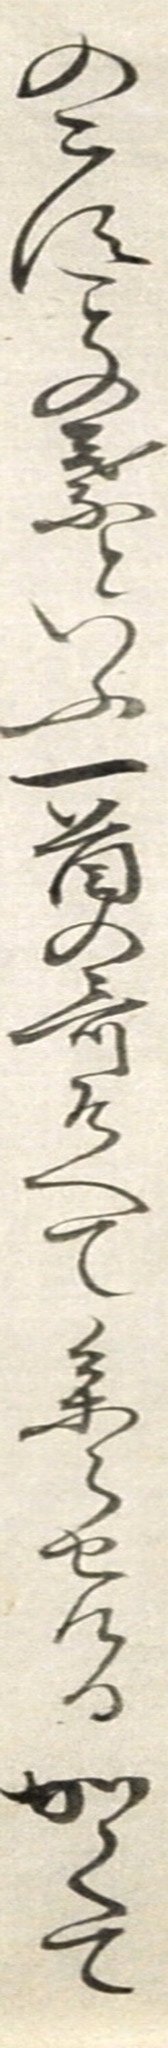のこすことの葉といふ一首の哥そへて参らせけるかくて
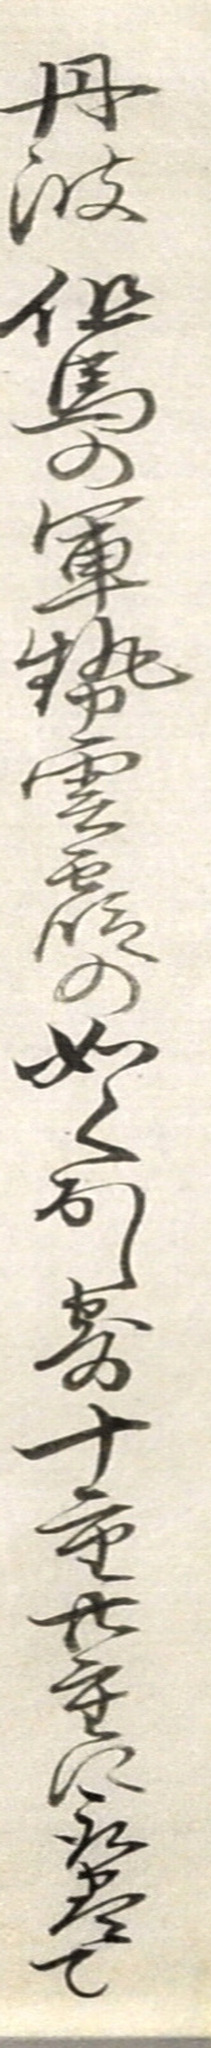丹波但馬の軍勢雲霞の如くおし寄十重廿重に取尽て
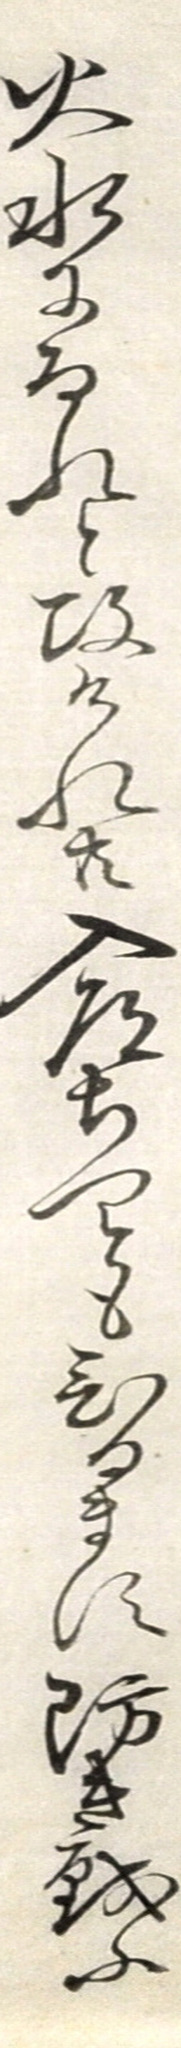火水になれと攻けれ共入道ちつともひるます防き戦ふ
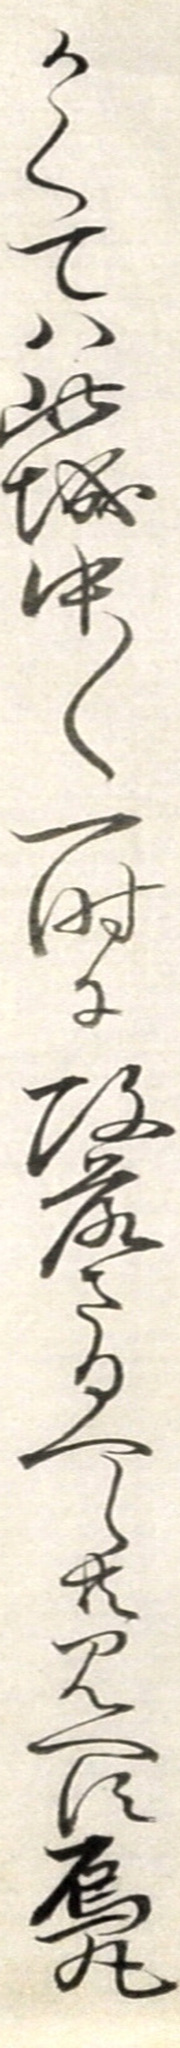かくては此城中〳〵一時に攻落さるへし共見へす烏丸
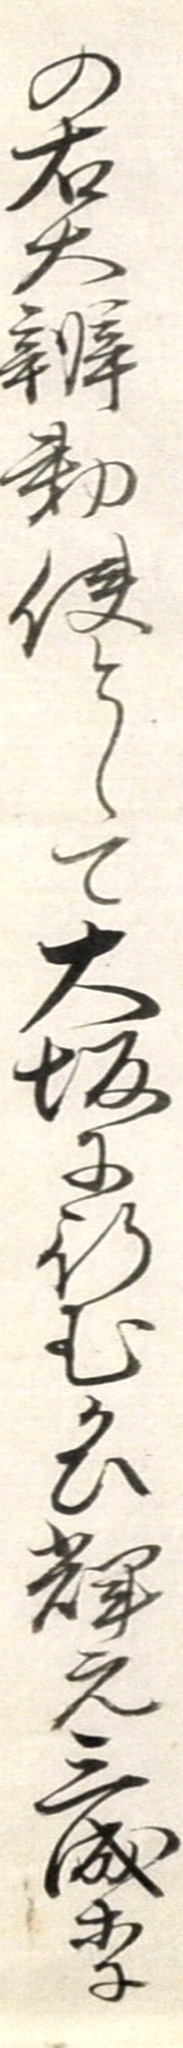の右大弁勅使として大坂に行むかひ輝元三成等に
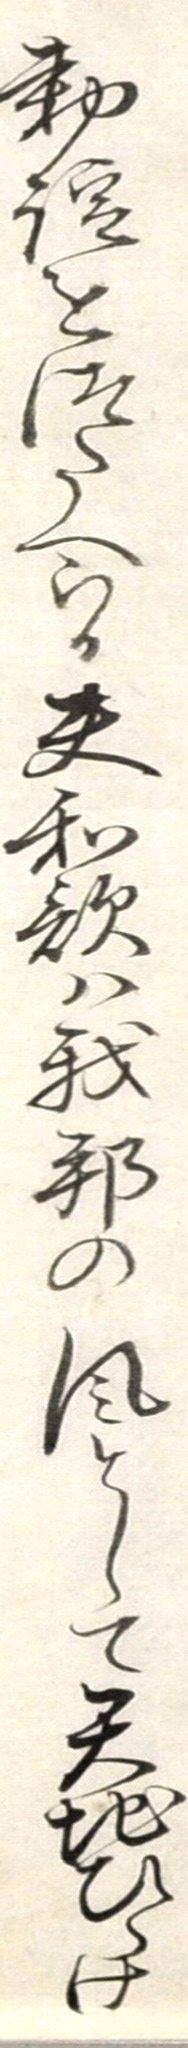勅諚をつたへらる夫和歌は我邦の風として天地ひらけ
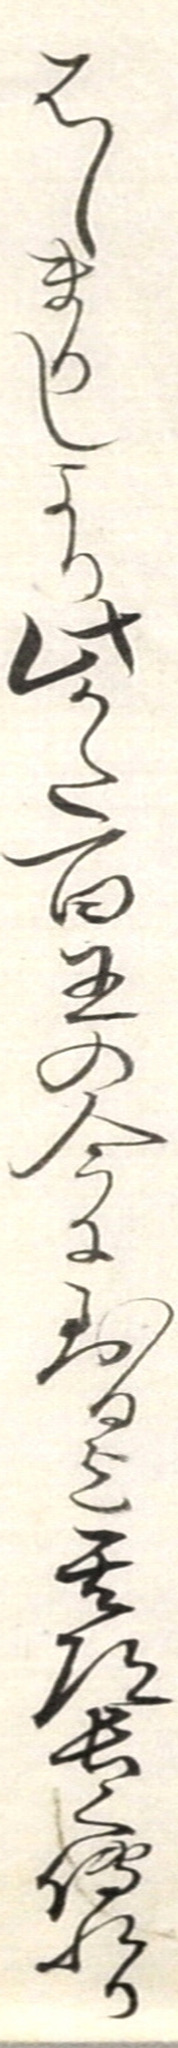はしまりしより此かた百王の今に至る迄其道長く伝れり
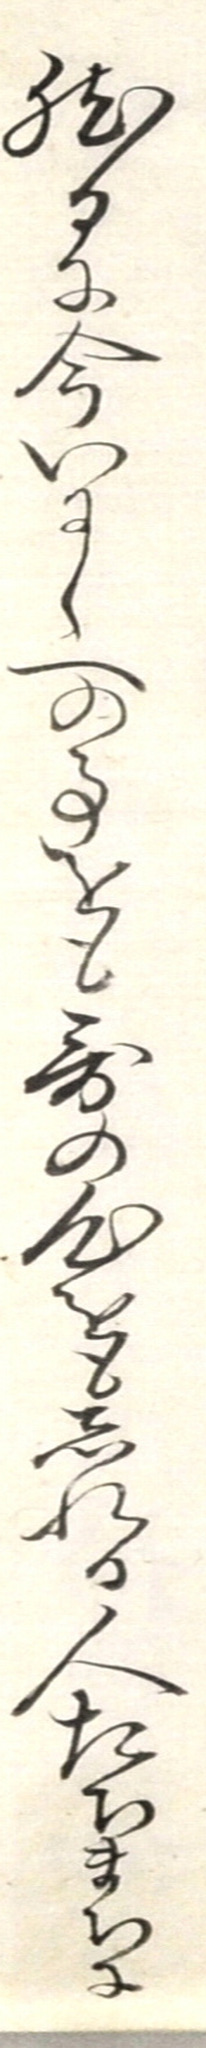然るに今いにしへの事をも哥の心をもしれる人たちまちに
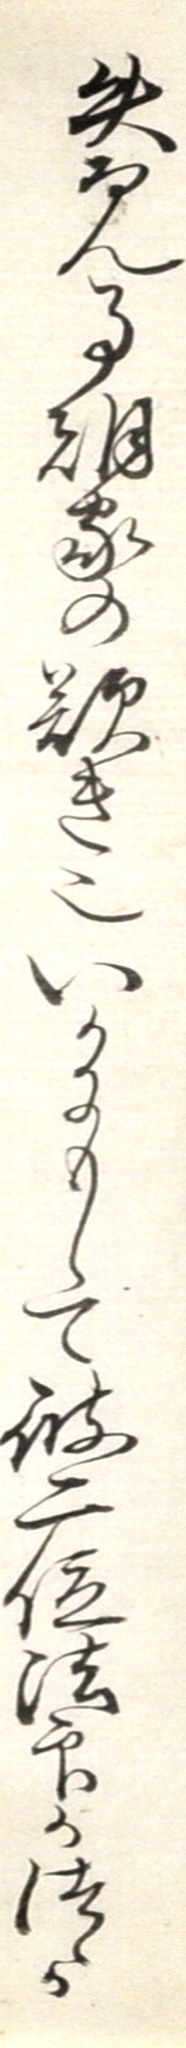失なん事朝家の歎き也いかにもして彼二位法印かつゝか
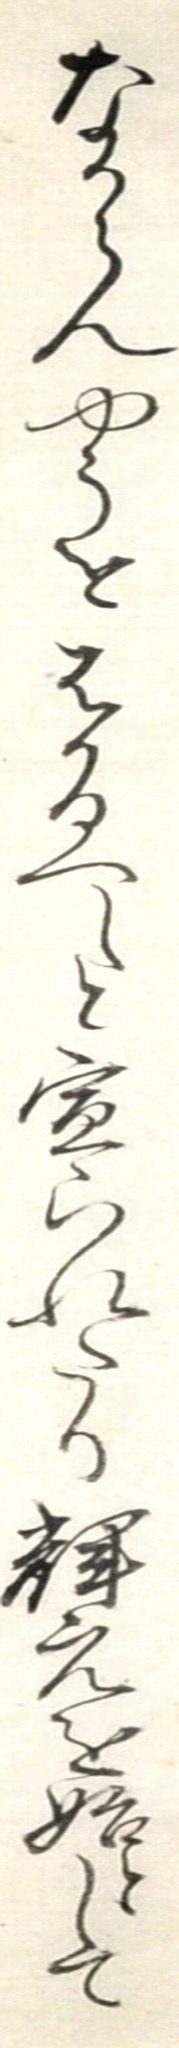なからんやうをはかるへしと宣られたり輝元を始として
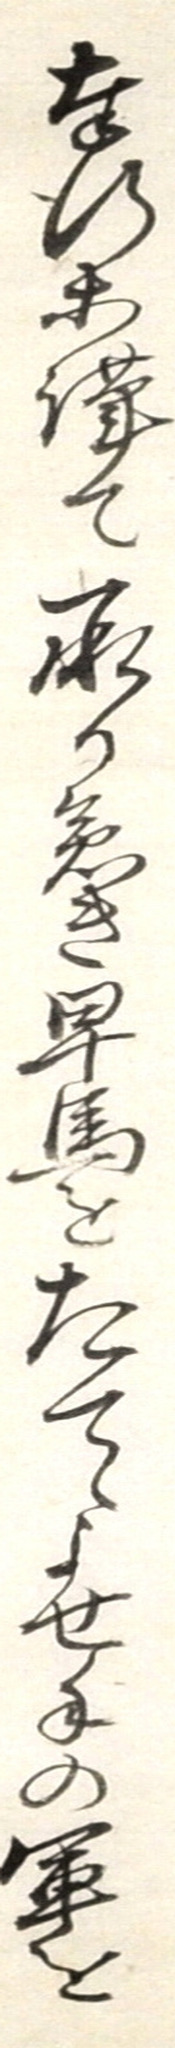奉行等謹て承り急き早馬をたてゝよせ手の軍を
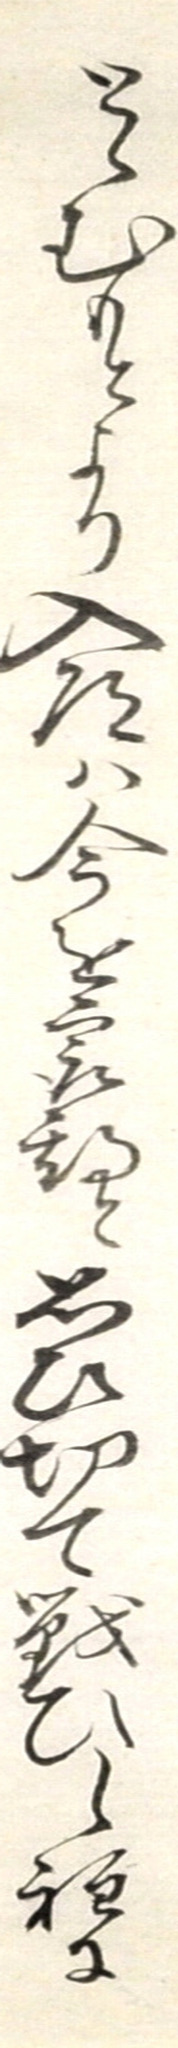とゝむもとより入道は今を最期と思ひ切て戦ひし程に
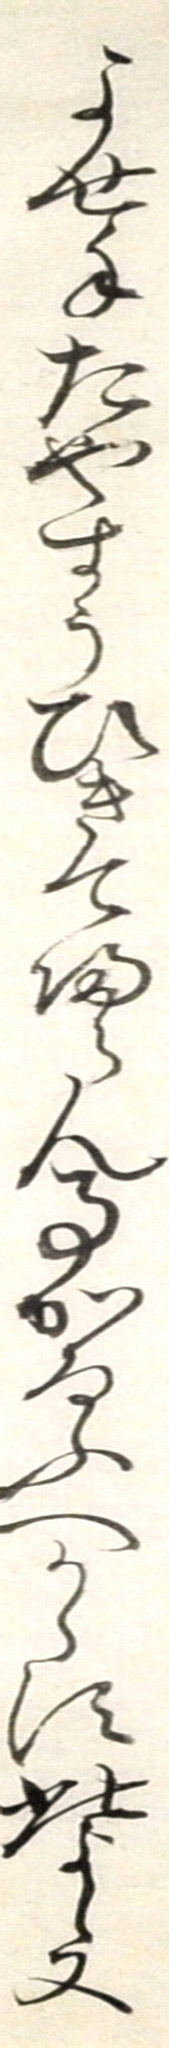よせ手たやすうひきて帰らん事かなふへからす此よし又
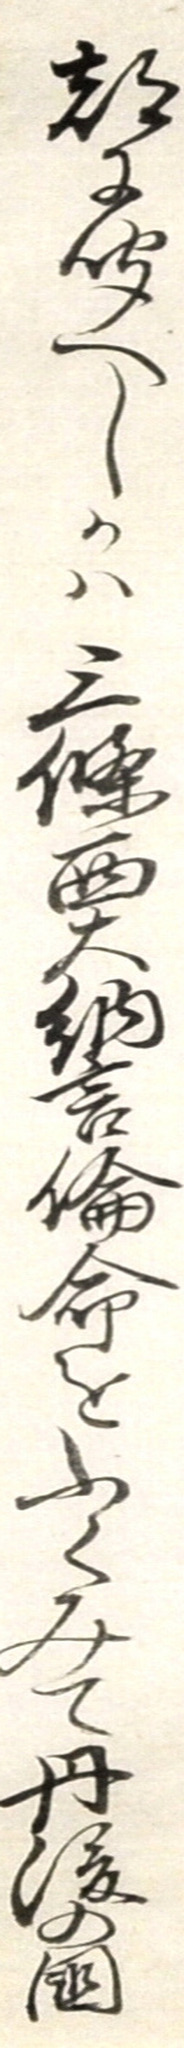都に聞へしかは三条西大納言綸命をふくみて丹後の国
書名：藩翰譜（七・下）
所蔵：伊那市立高遠町図書館・合同会社AMANE
